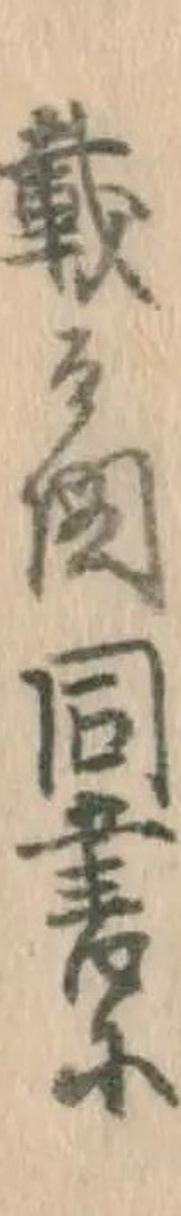載る図同書に
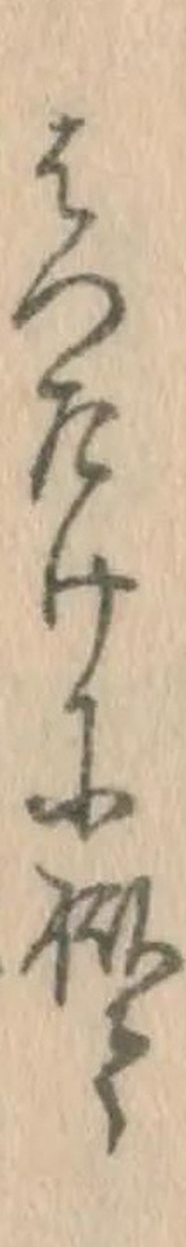はつたけに似て
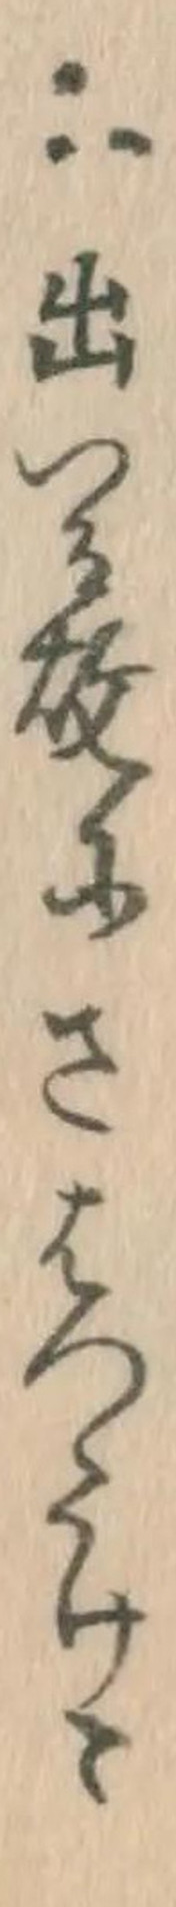∴出つる故にはつたけと
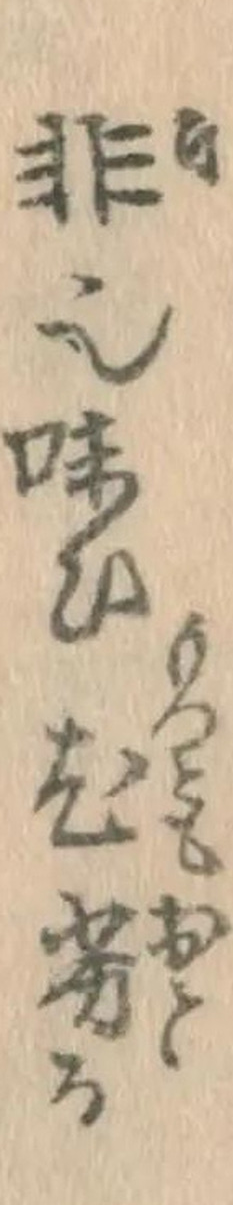非也味ひ尤劣る
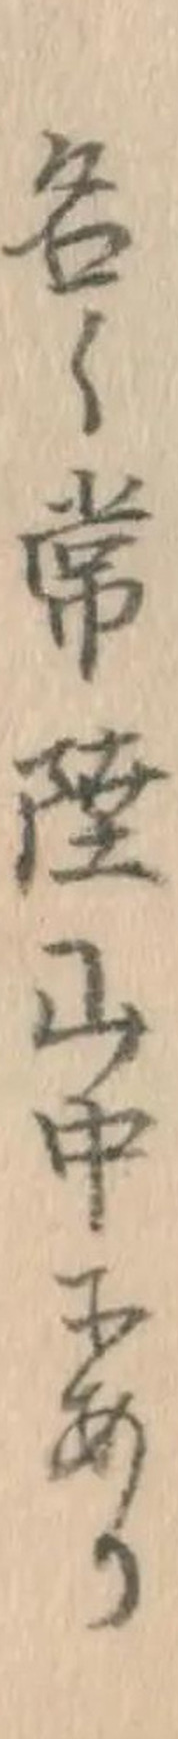名く常陸山中にあり
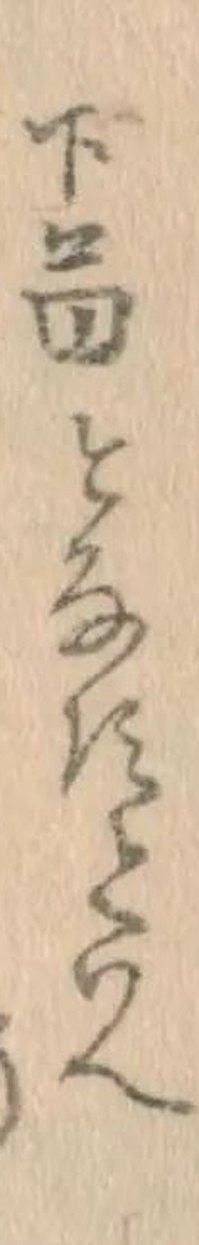下品となすといへり
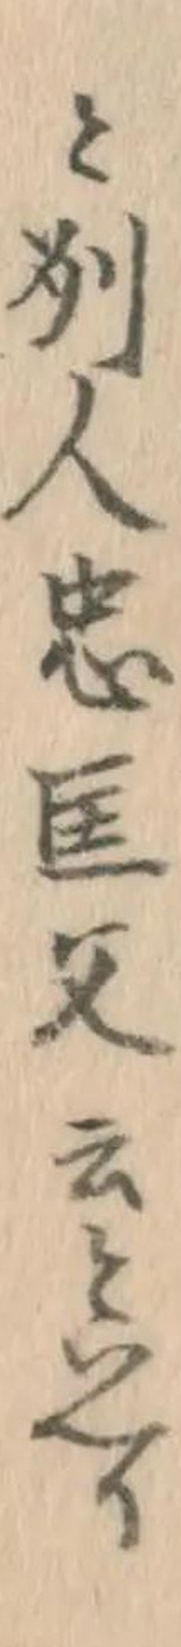と州人忠匡父云といへり

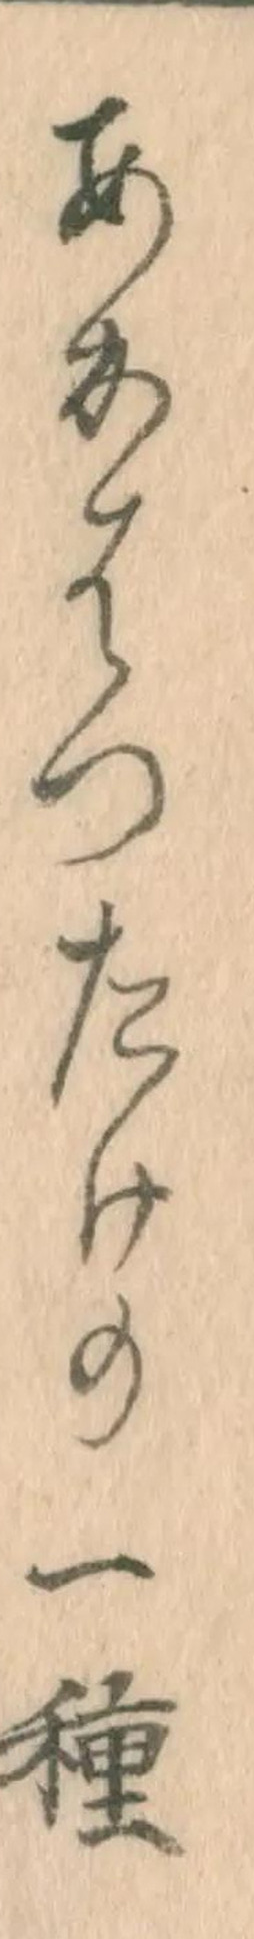あかはつたけの一種
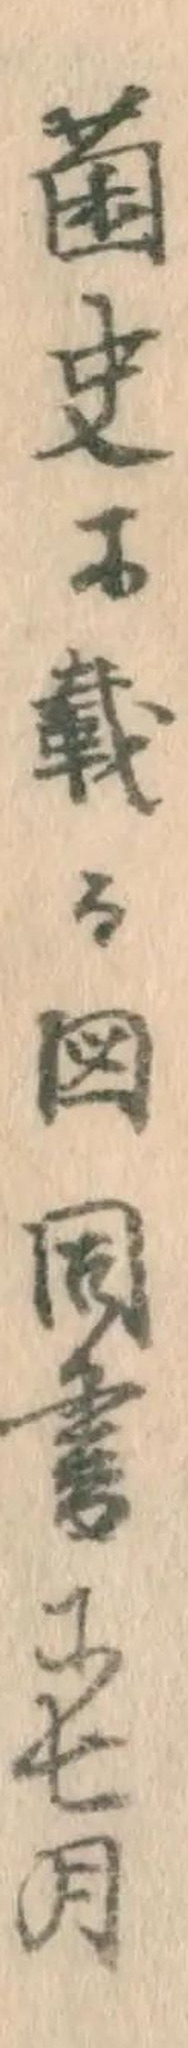菌史に載る図同書に七月
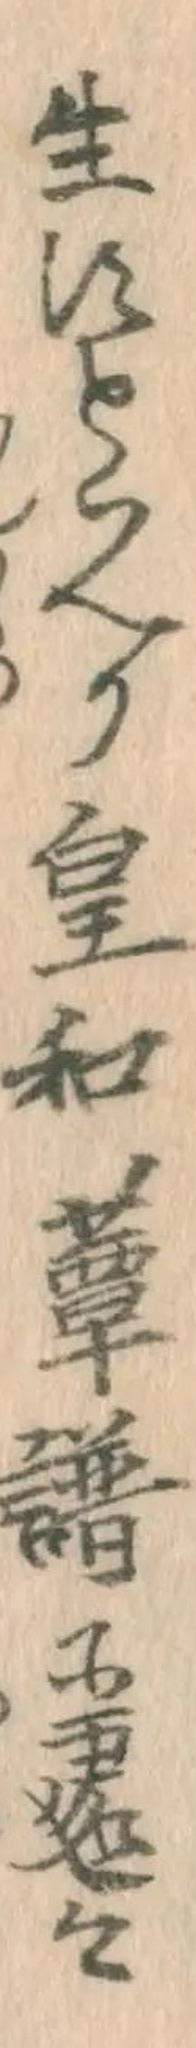生すといへり皇和蕈譜に処々
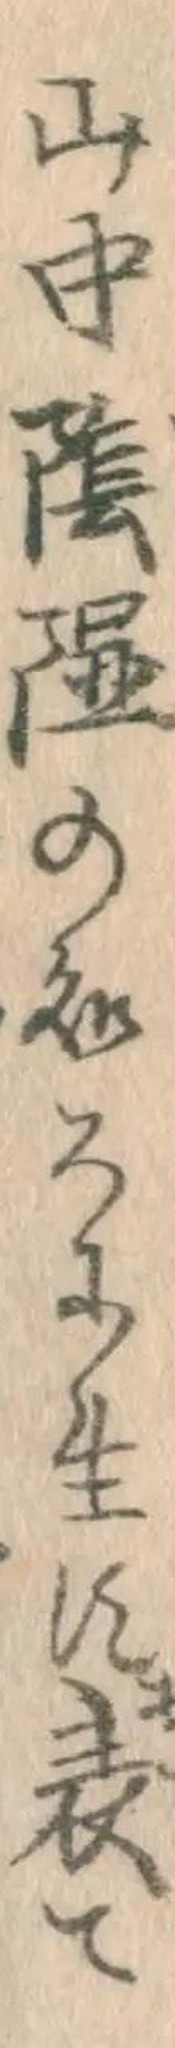山中陰湿の処ろに生す表て
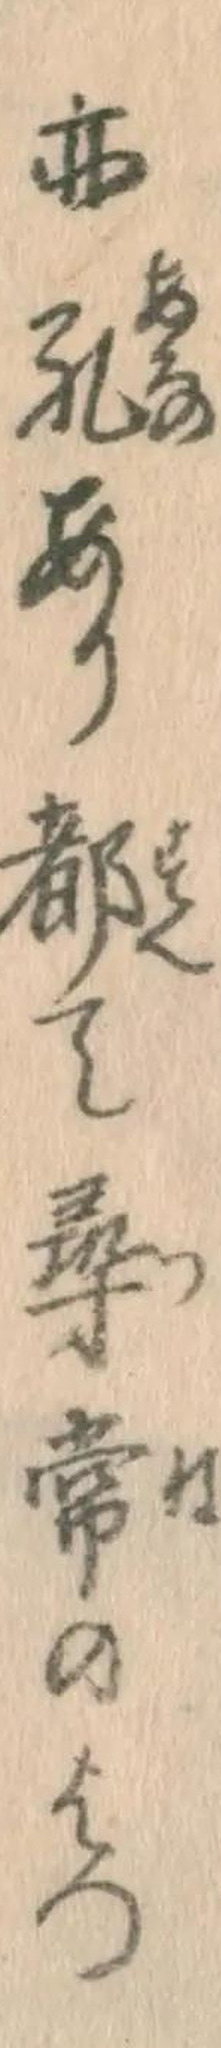亦孔あり都て尋常のはつ
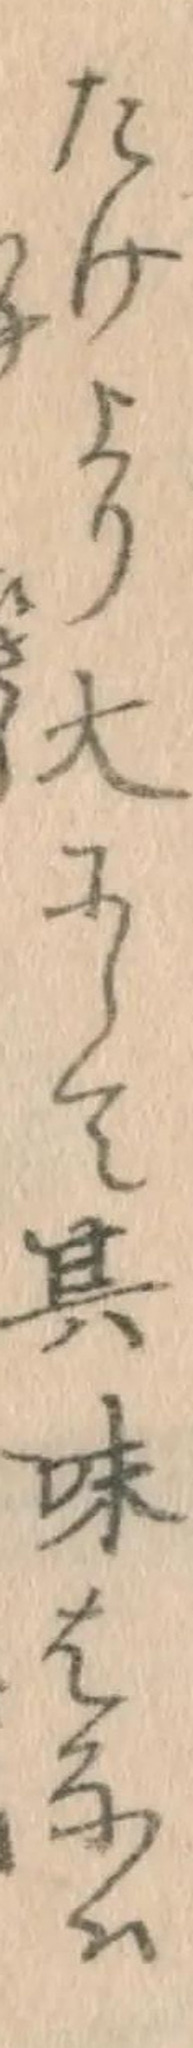たけより大にして其味はなは
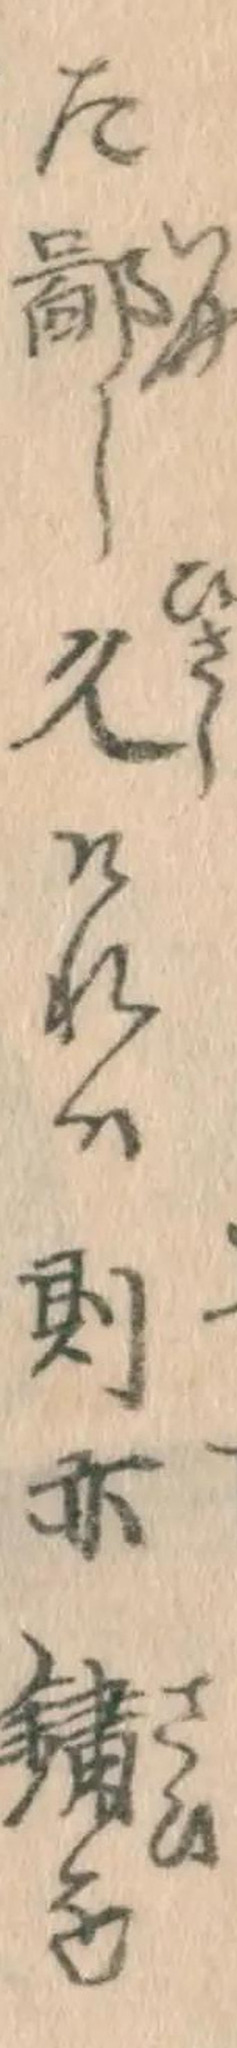た鄙し久けれは則亦錆を
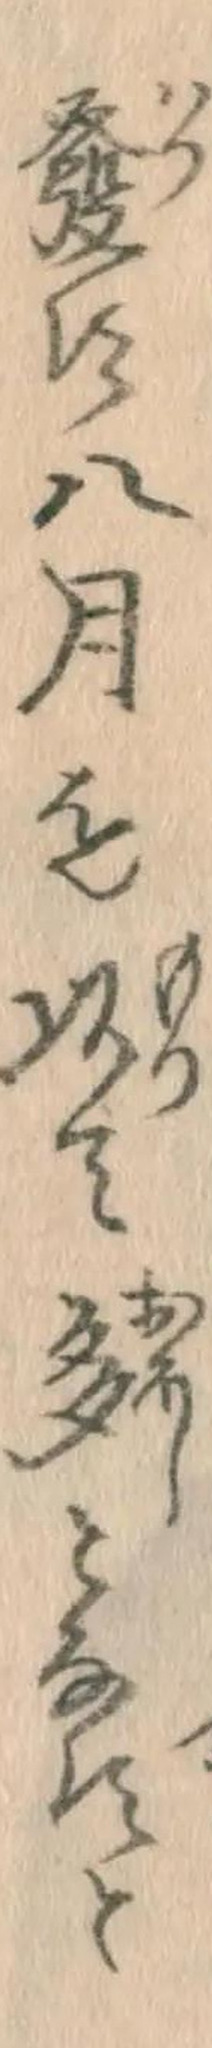発す八月を以て多となすと
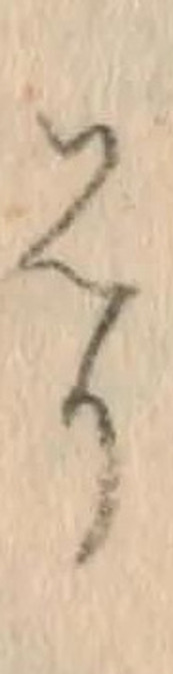いへり
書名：本草図譜. 巻55-57
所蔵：国立国会図書館 National Diet Library, JAPAN
